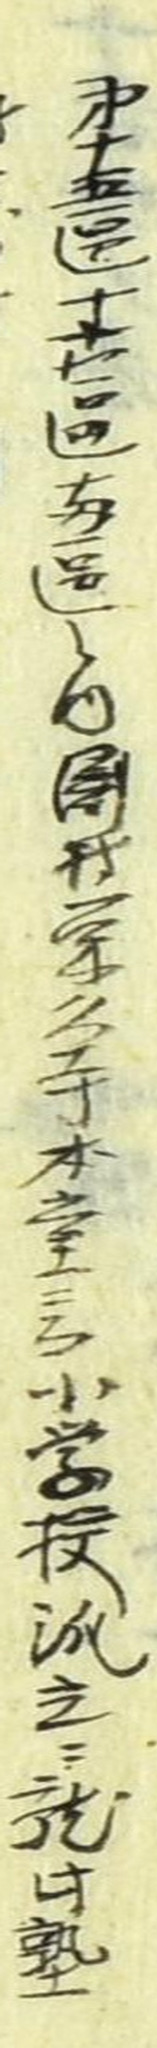第十五区十六区両区之内淵村栄久寺本堂ニ而小学校派立ニ就此塾
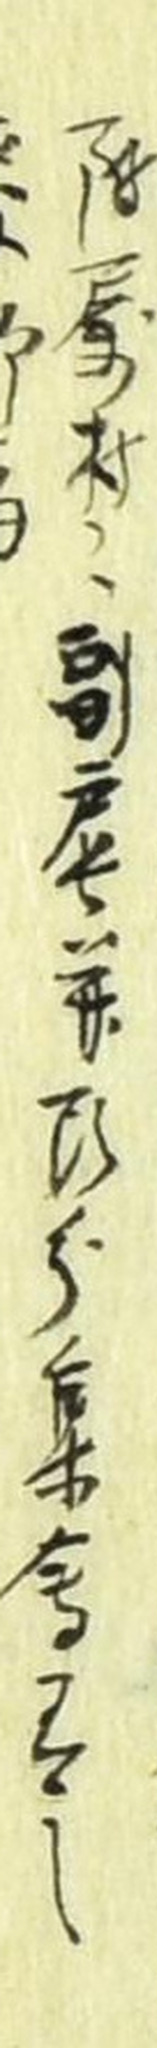附属村々副戸長幷頭分集会有之
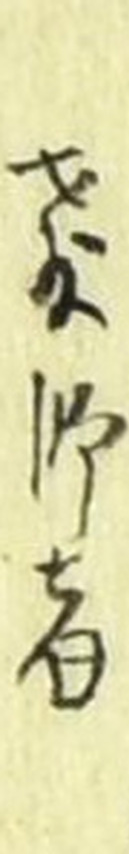教師者

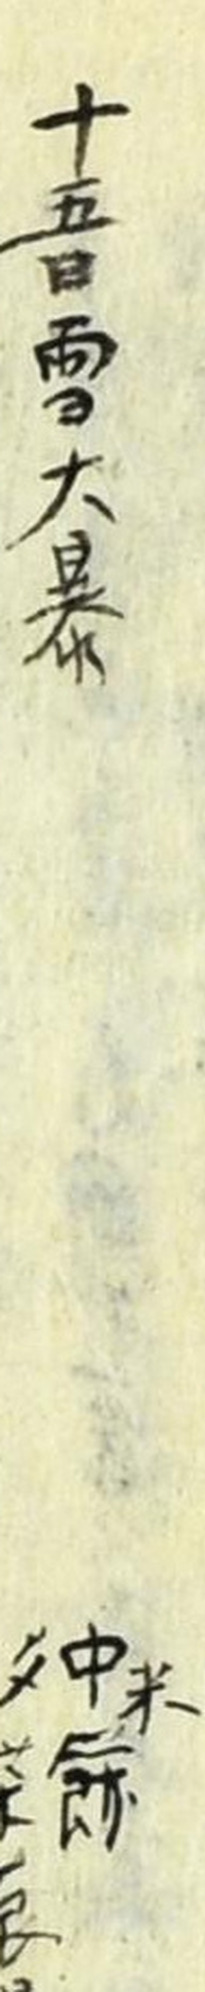十五日雪大暴中米餅
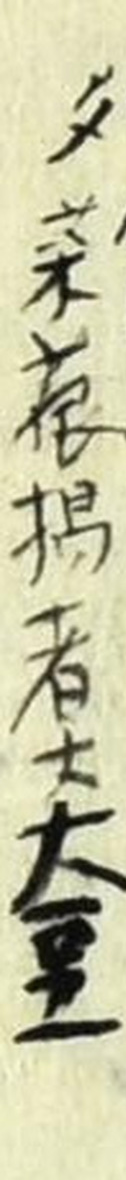夕菜菔揚煮大豆
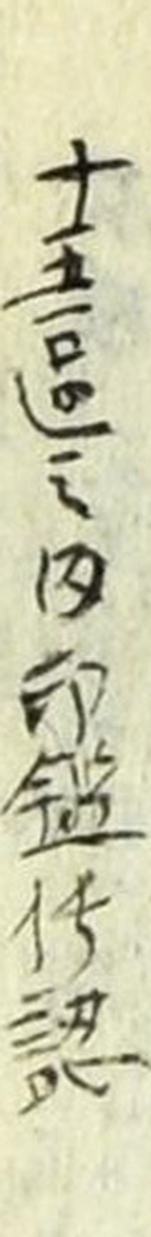十五区之内印鑑帳認
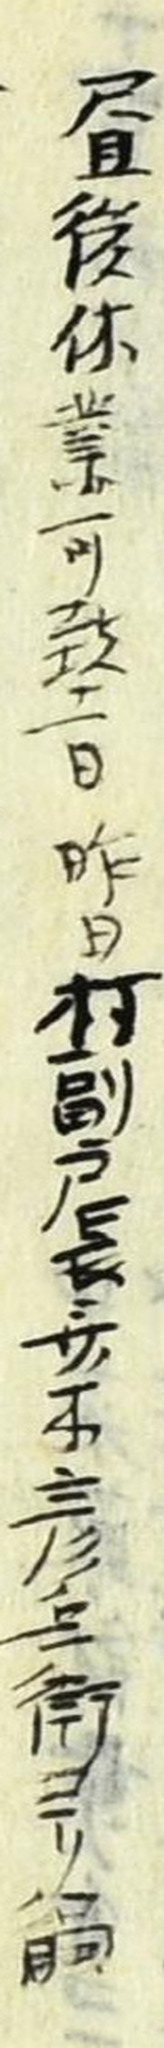昼後休業可致旨昨日村副戸長斉木彦兵衛ヨリ触
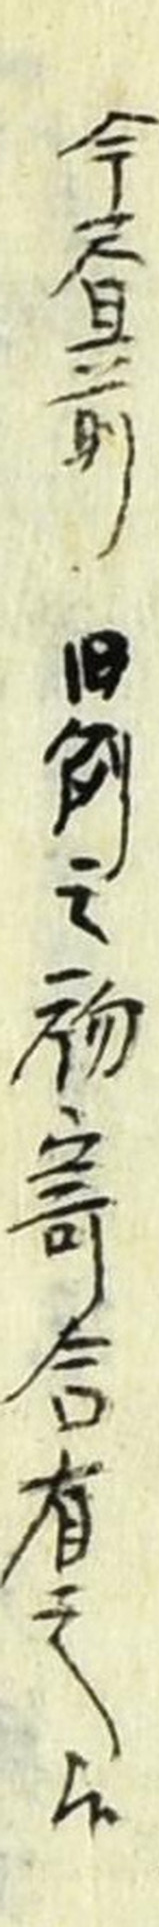今昼前旧例之初寄合有之候
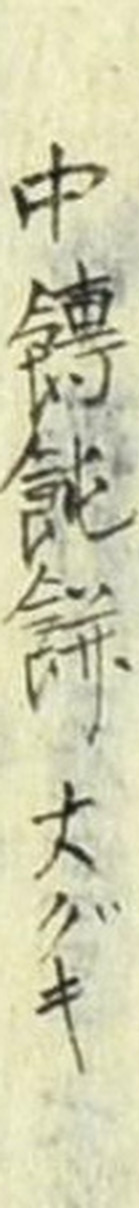中餺飩餅大グキ
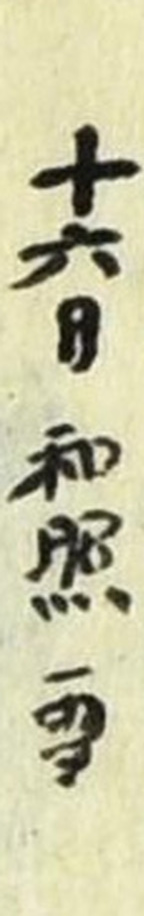十六日和照雪夕
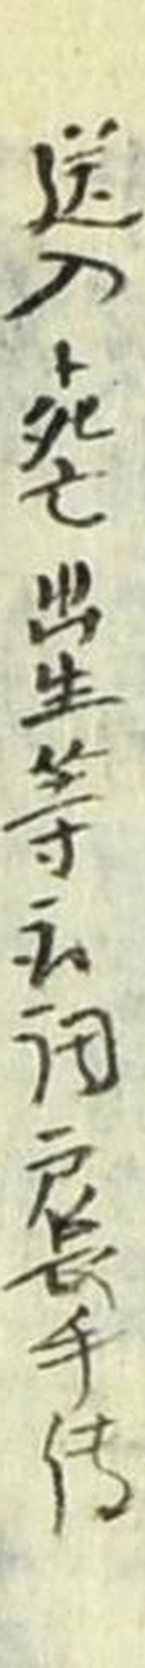送入ト死亡出生等取調戸長手伝
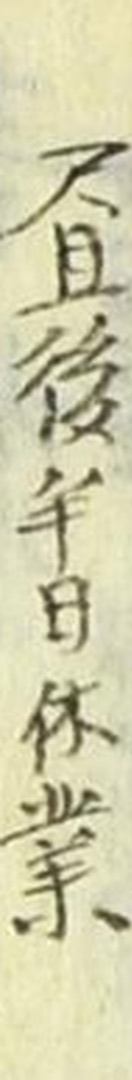昼後半日休業
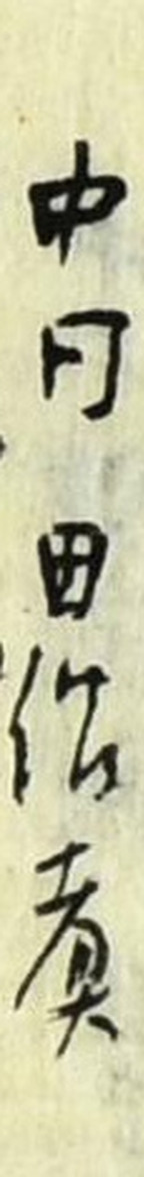中同田作煮
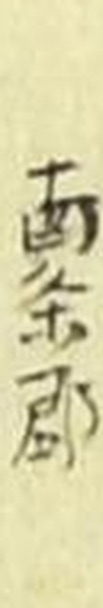南条郡
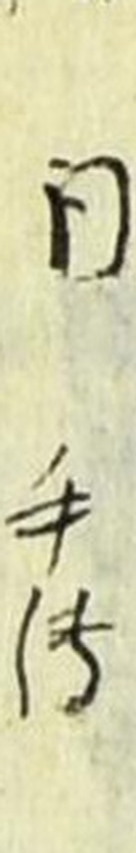同手伝
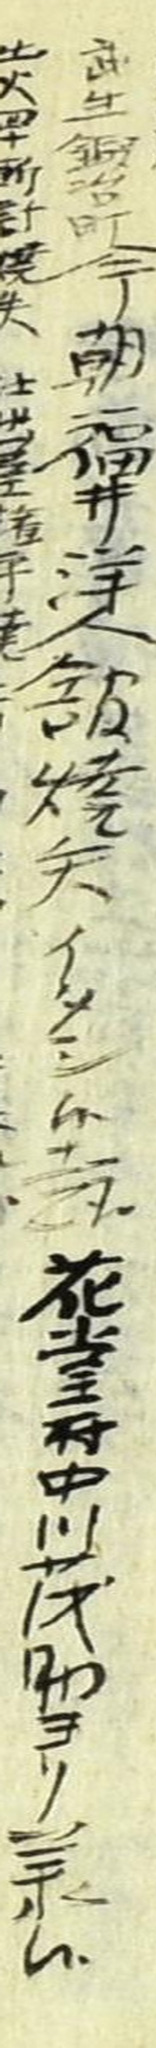今朝洋人館焼失イタシ候趣花堂村中川茂助ヨリ承候
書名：（日記）
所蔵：福井県文書館 Fukui Prefectural Archives
